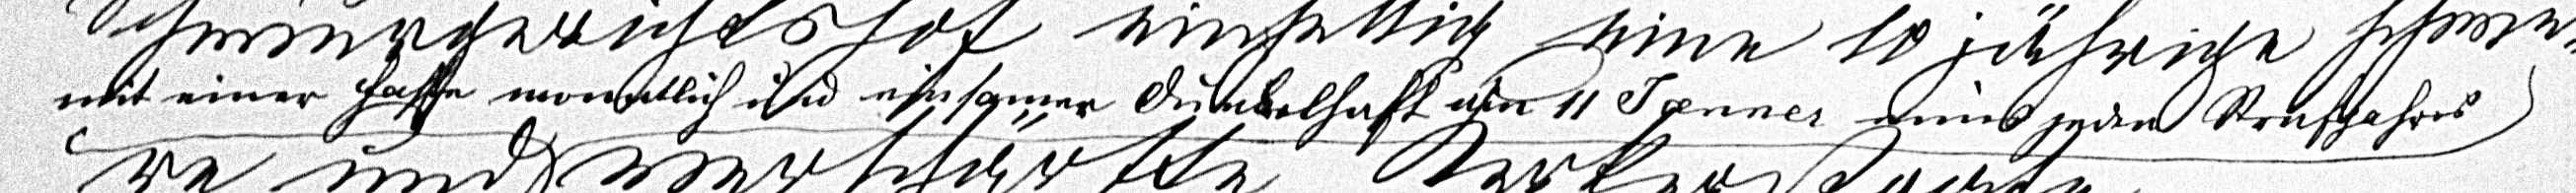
mit einer Hasse monatlich und einsamer Dünkelhaft am 11 Janner eines jeden Strafgehres
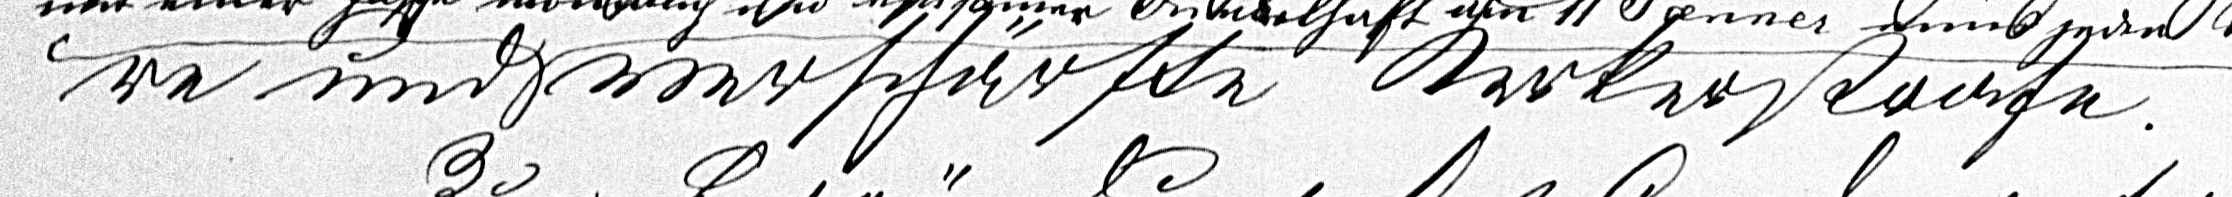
re und verschärfte Kerkerstrafe.
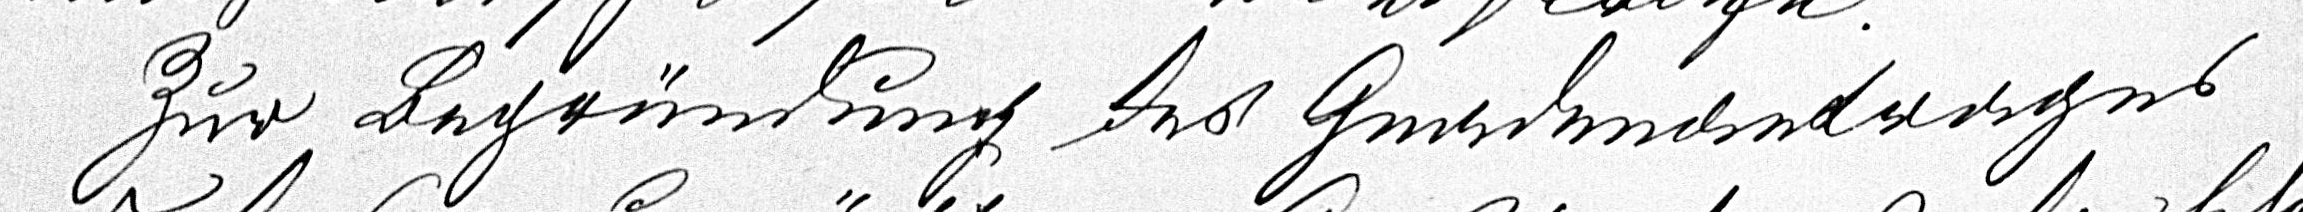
Zur Begründung des Gnadenantrages
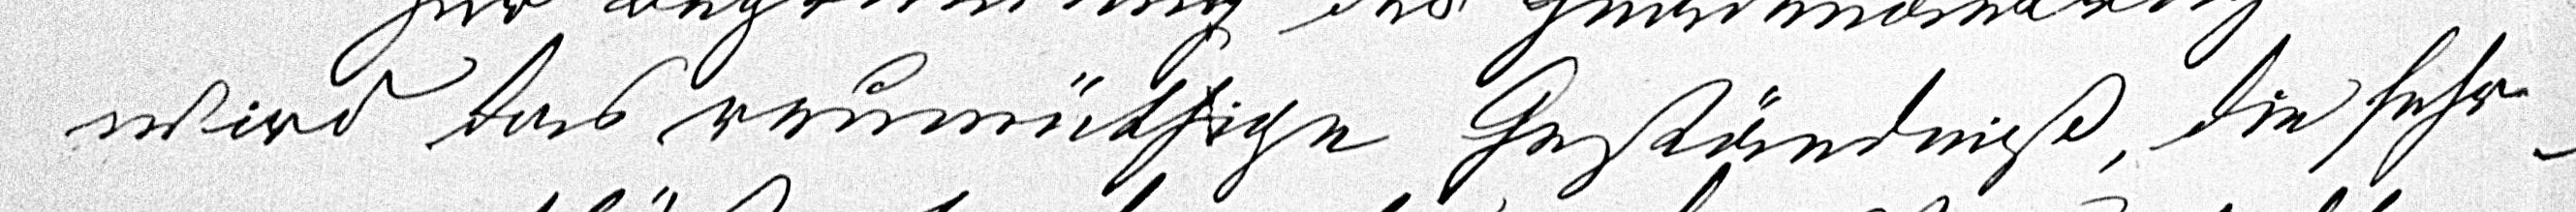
wird das reumütige Geständniß, die sehr
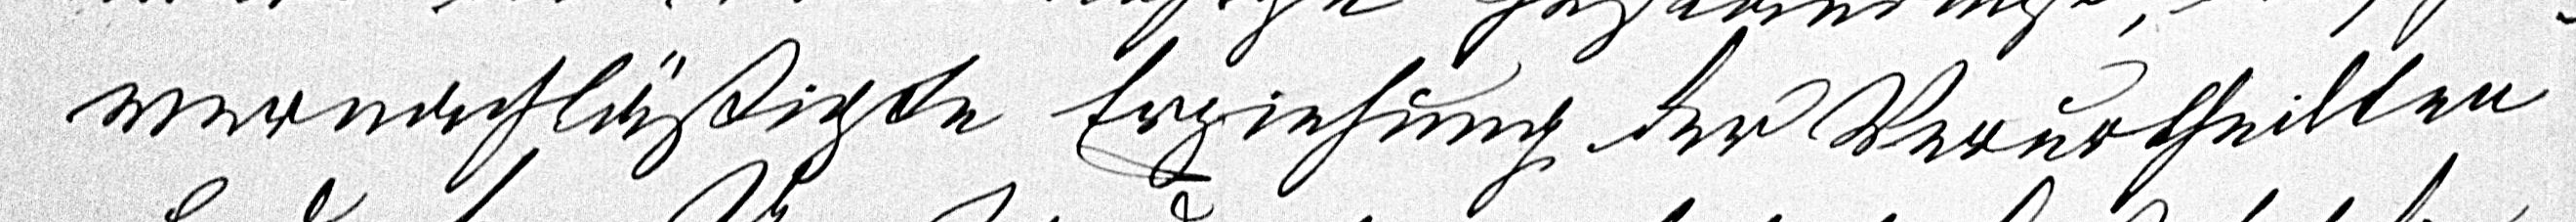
vernachläßigte Erziehung der Verurtheilten
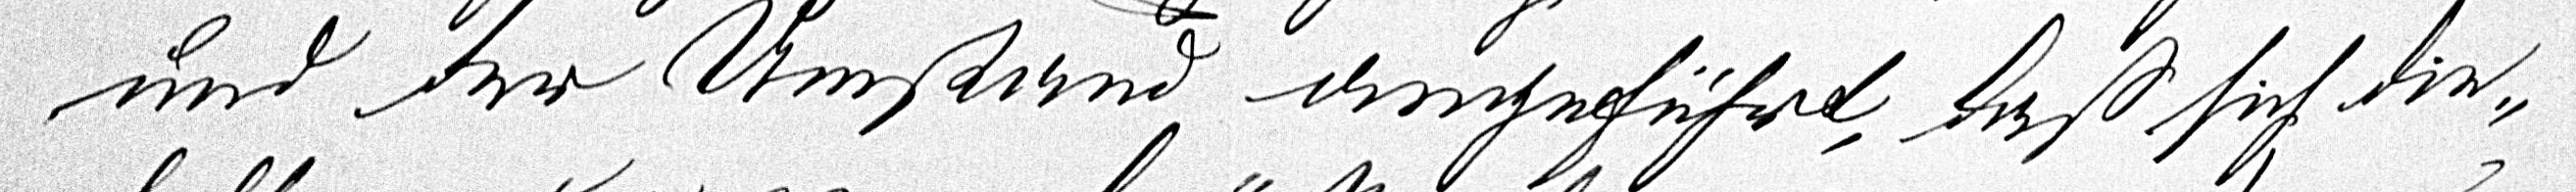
und der Umstand angeführt, daß sich die¬
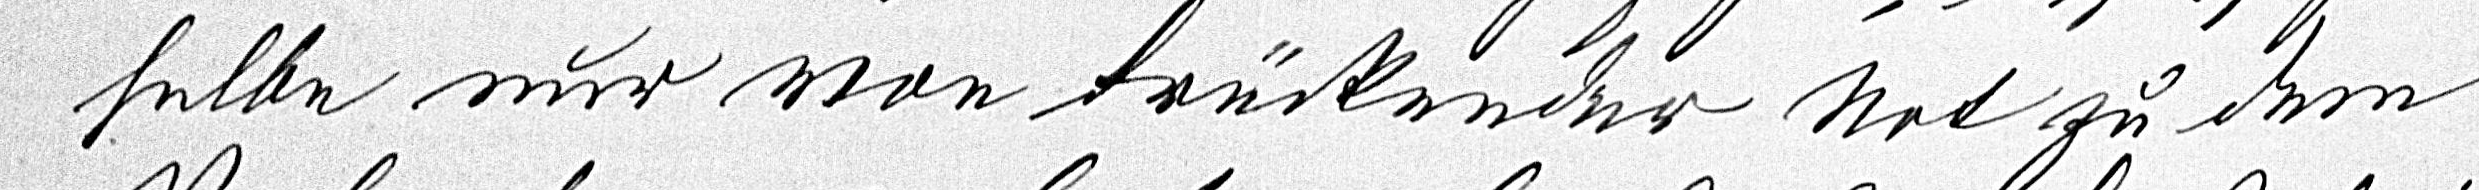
selbe nur von brückender not zu dem
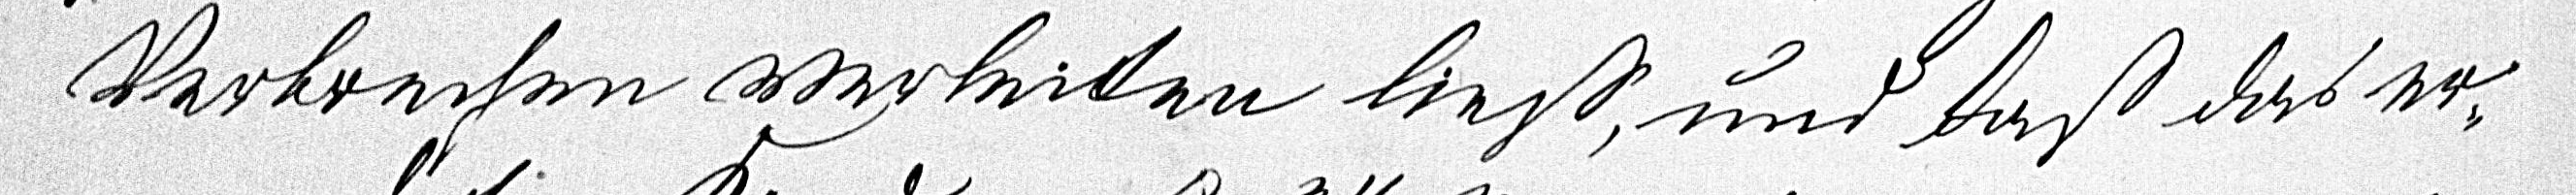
Verbrechen verleiten ließ, und daß das er¬
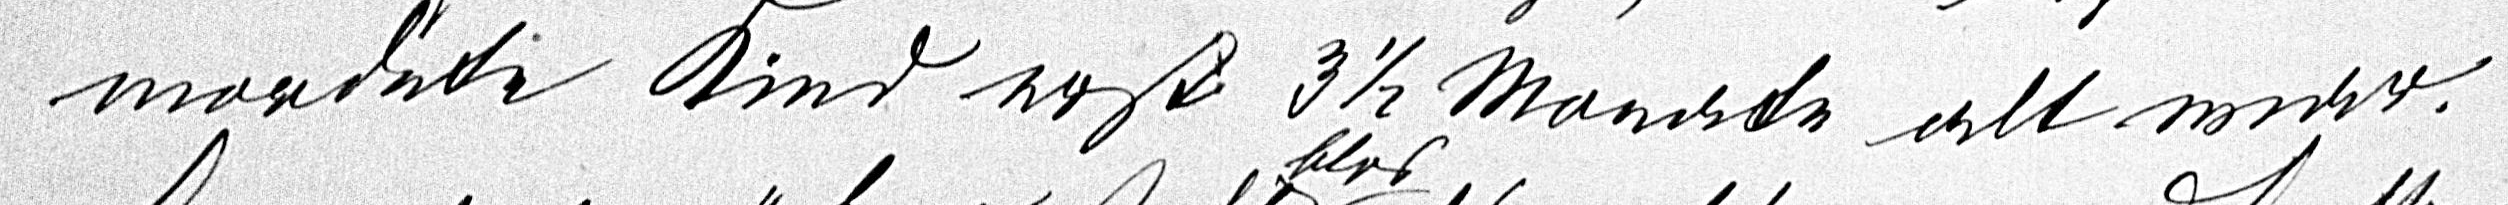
mordete Kind erst 3 1/2 Monate alt war.
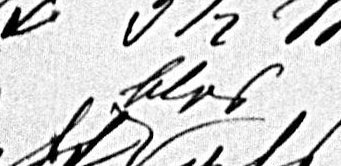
als
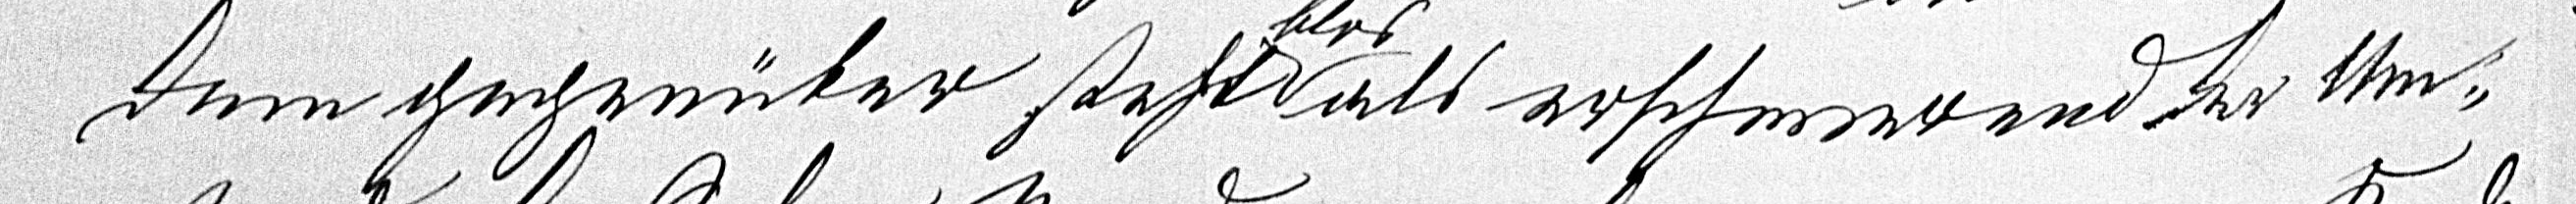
Dem gegenüber steht blos erschwerend der Um¬
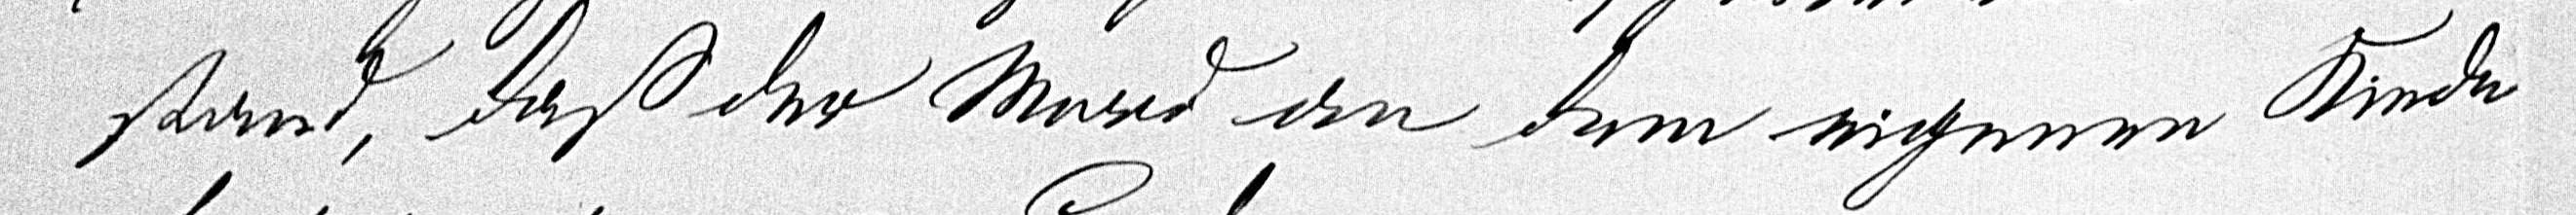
stand, daß der Mord an dem eigenen Kinde
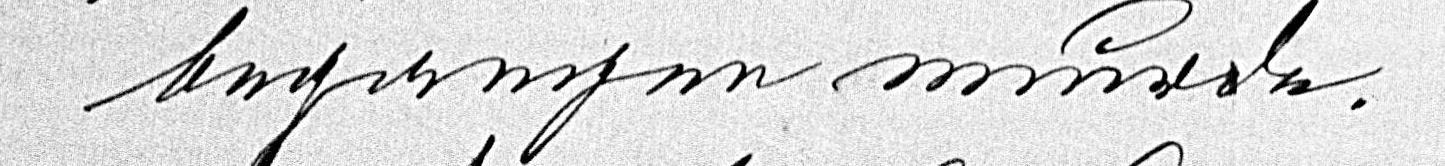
begangen wurde.
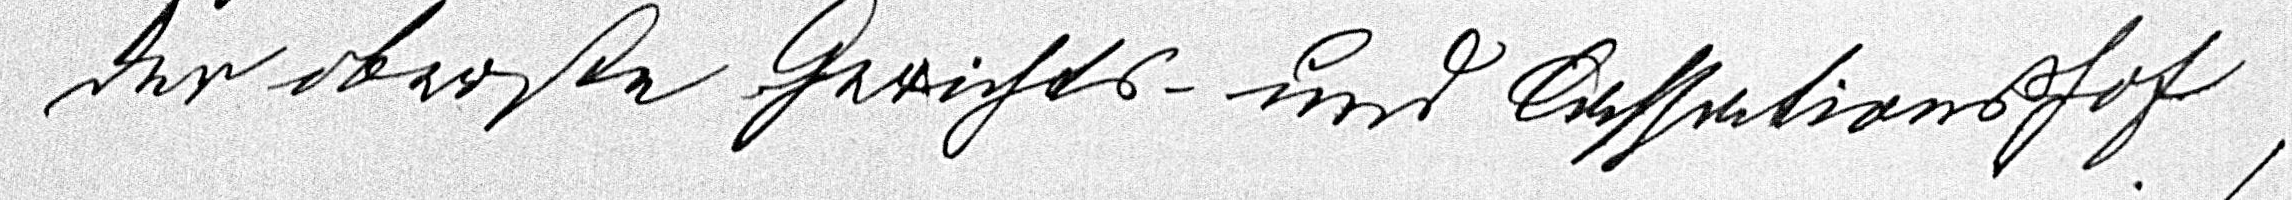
Der oberste Gerichts- und Cassationshof
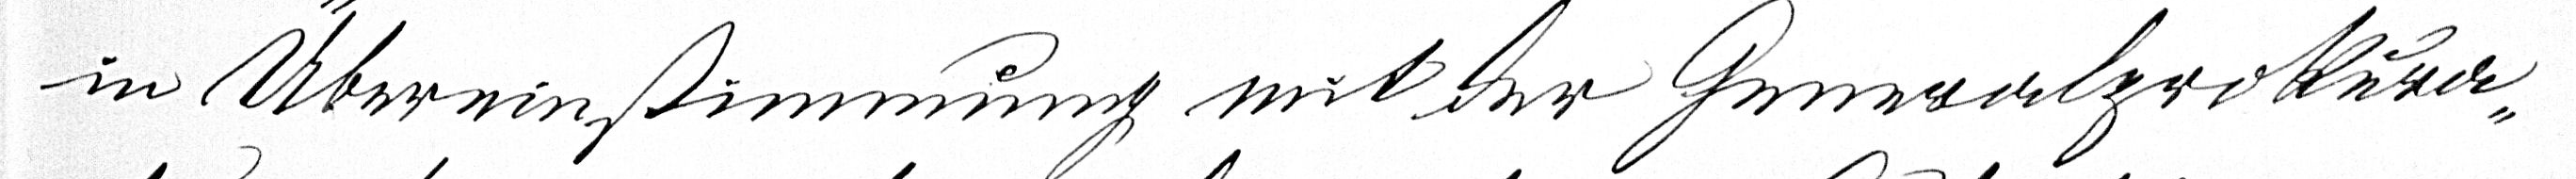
in Übereinstimmung mit der Generalprokura¬
